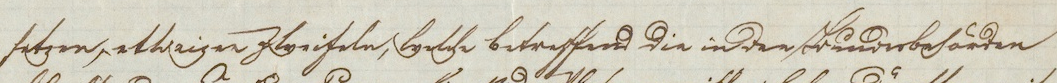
setzen, etwaigen Zweifeln, welche betreffend die in den Bundesbehörden
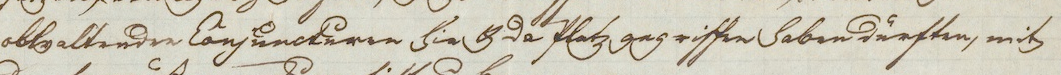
obwaltenden Conjuncturen hie & da Platz gegriffen haben dürften, mit
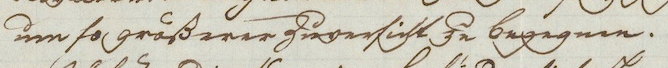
um so größerer Zuversicht zu begegnen.
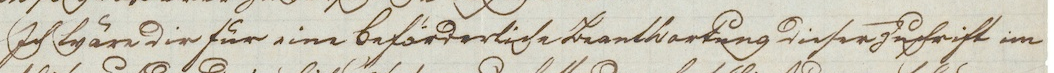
Ich wäre Dir für eine beförderliche Beantwortung dieser Zuschrift im
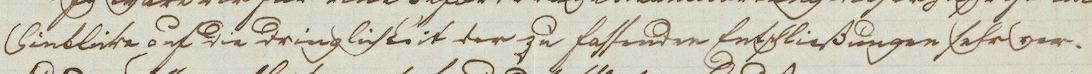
Hinblicke auf die Dringlichkeit der zu fassenden Entschließungen sehr ver-
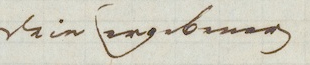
Dein ergebener
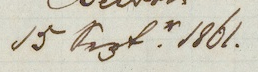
15 Septr 1861.
